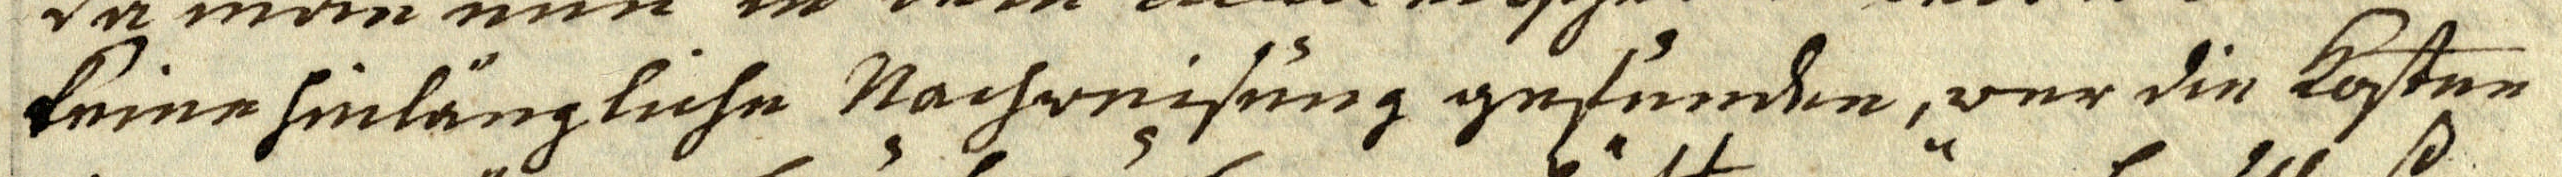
keine hinlängliche Nachweisung gefunden, wer die Kosten
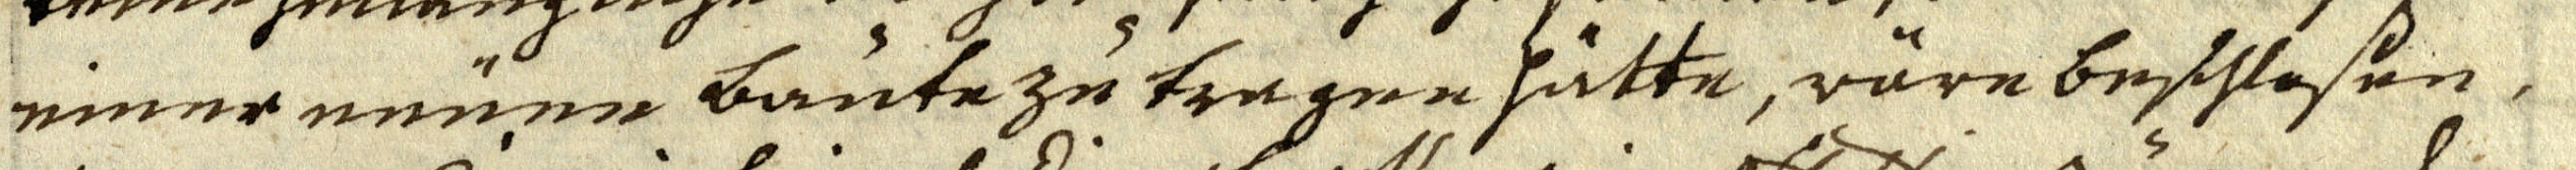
einer neuen Baute zu tragen hätte, wäre beschloßen,
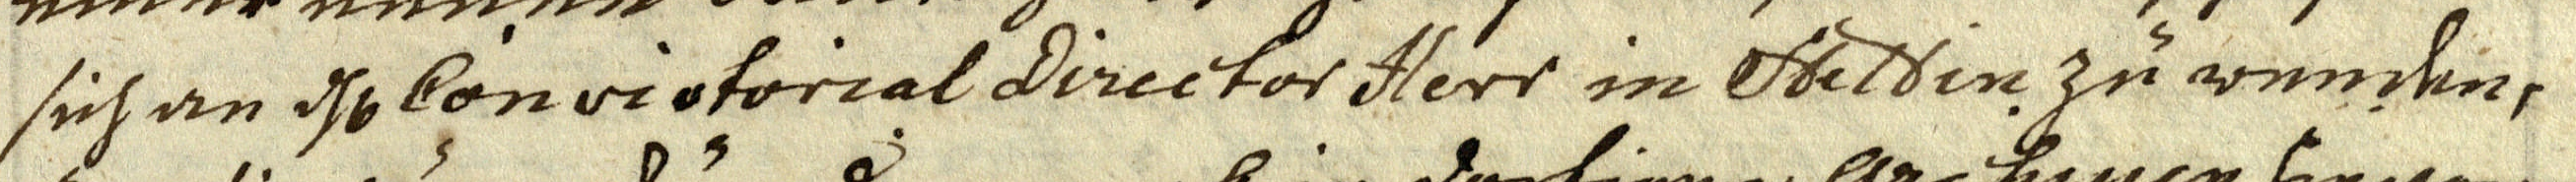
sich an dh. Consistorial Director Herr in Stettin zu wenden,
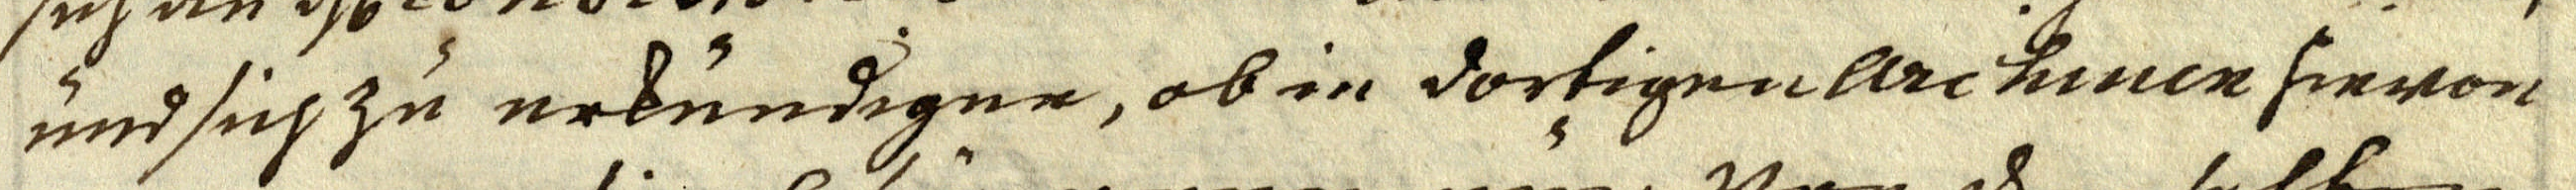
und sich zu erkundigen, ob in dortigen Archiven hievon
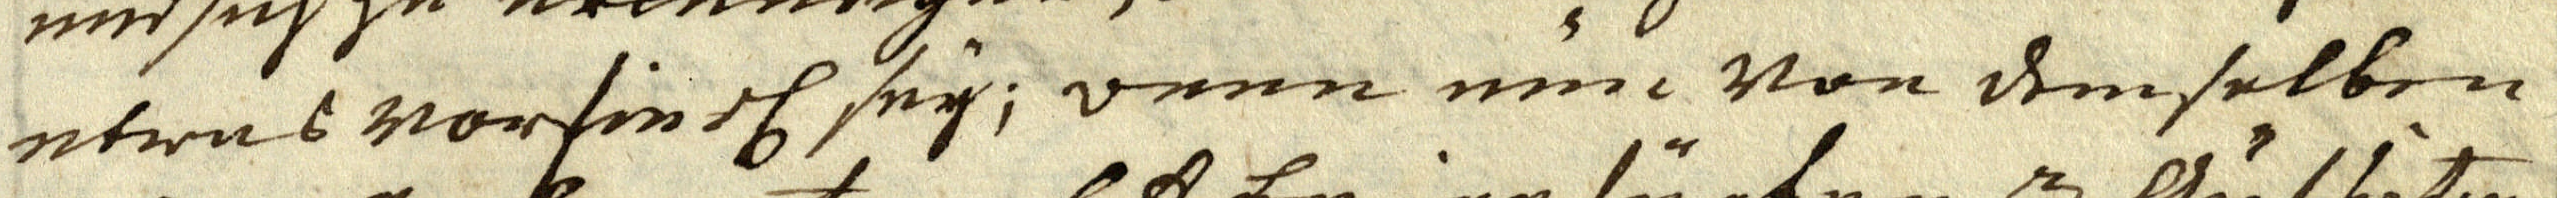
etwas vorfindl. seÿ; wenn nun von demselben
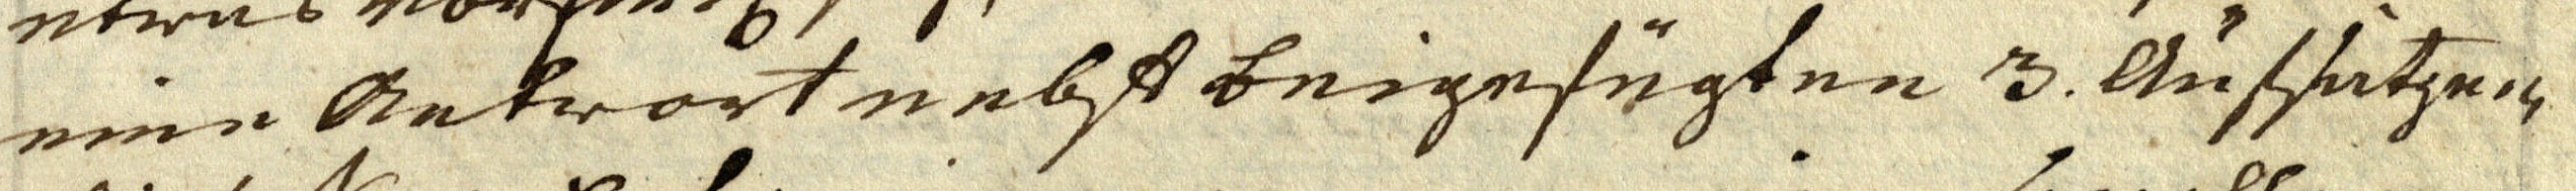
eine Antwort nebst beigefügten 3 Aufsätzen
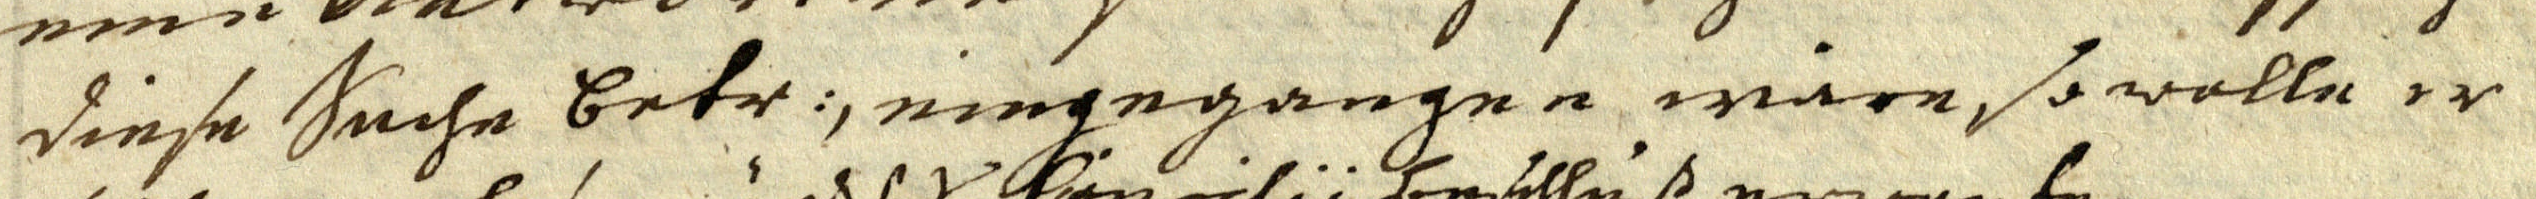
diese Sache betr., eingegangen wäre, so wolle er
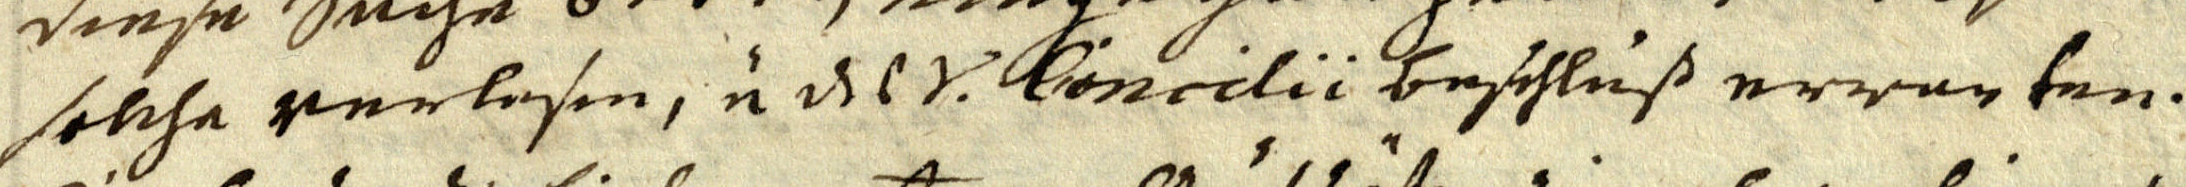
solche verlesen, u des V. Concilii Beschluß erwarten.
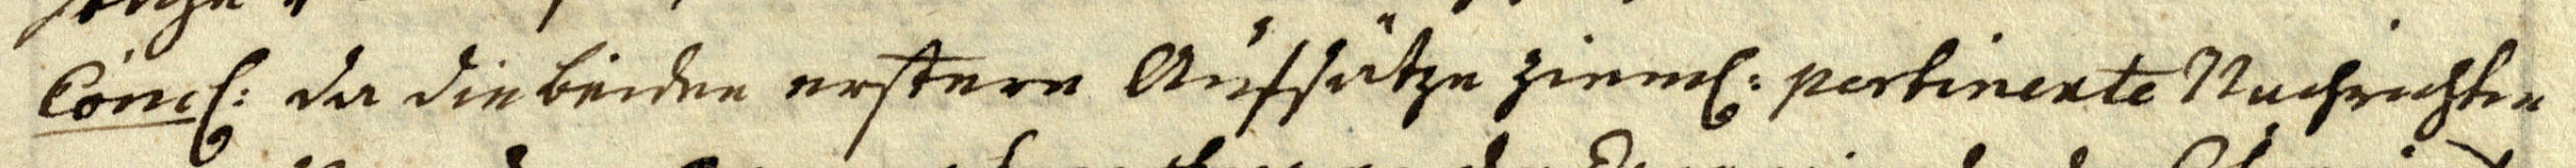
Concl. Da die beiden erstern Aufsätze zieml. pertinente Nachrichten
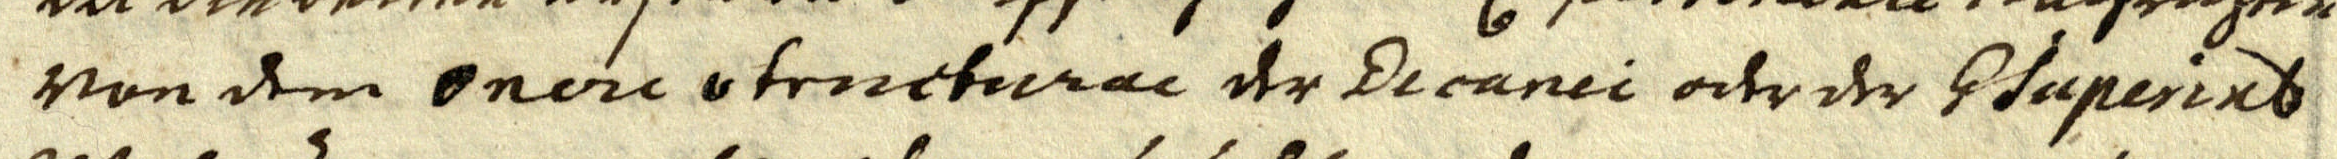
von dem onere s tructurae der Decanii oder der G Superint.
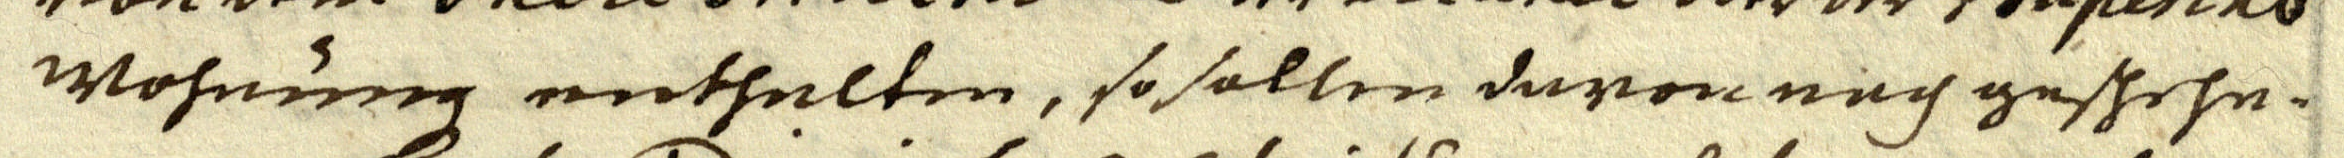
Wohnung enthalten, so sollen davon nach geschehe¬
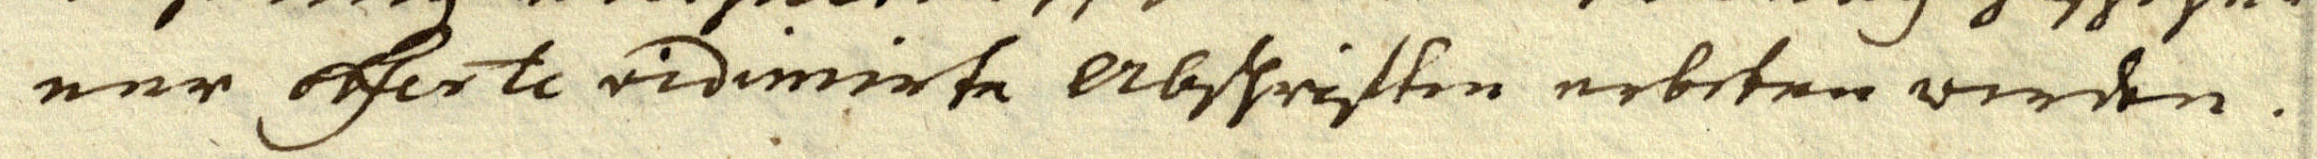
ner offerte vidimirte Abschriften erbeten werden.
